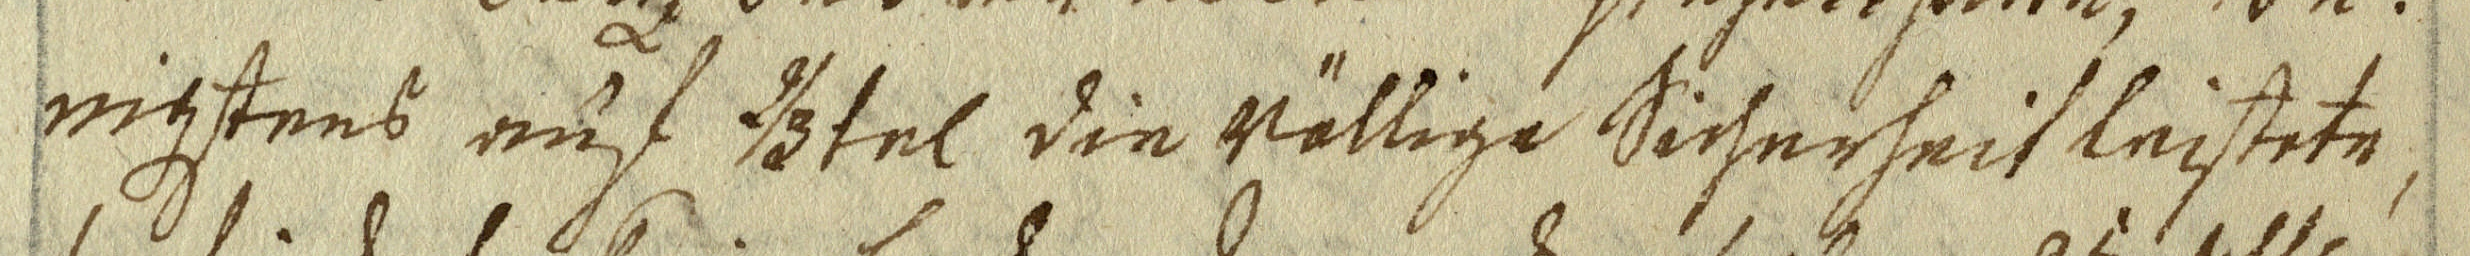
nigstens auf 2/3tel die völlige Sicherheit leistete,
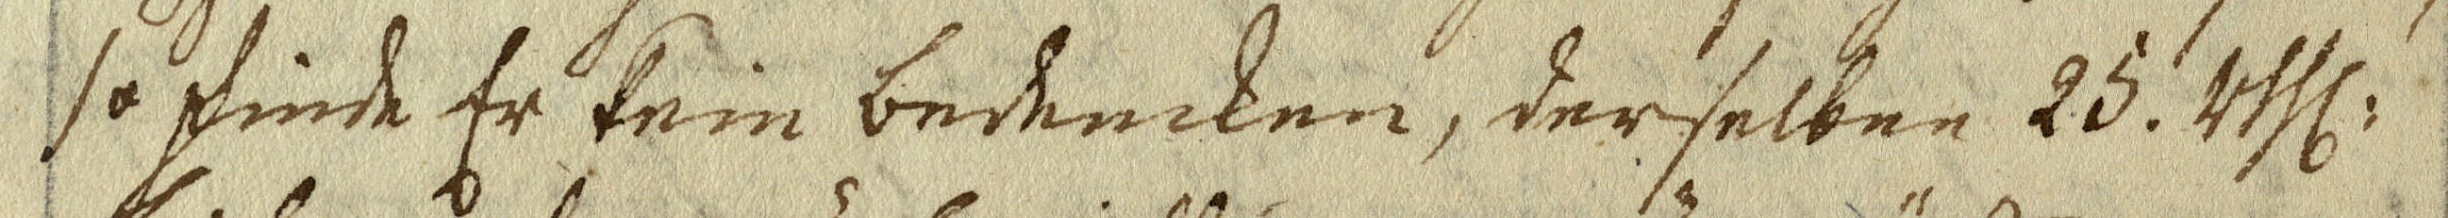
so finde Er kein Bedencken, derselben 25 rtl.
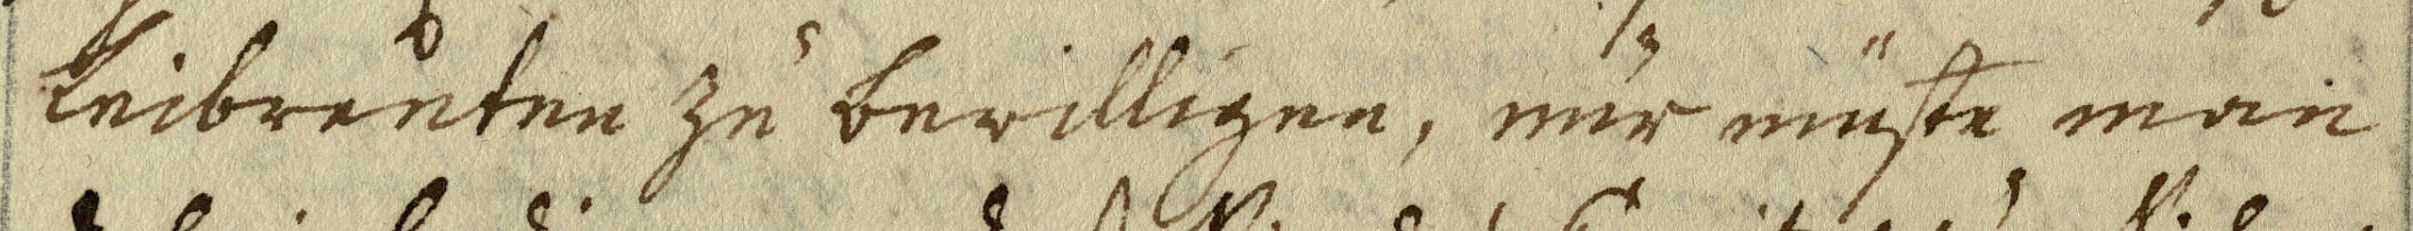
Leibrente zu bewilligen, nur müste man
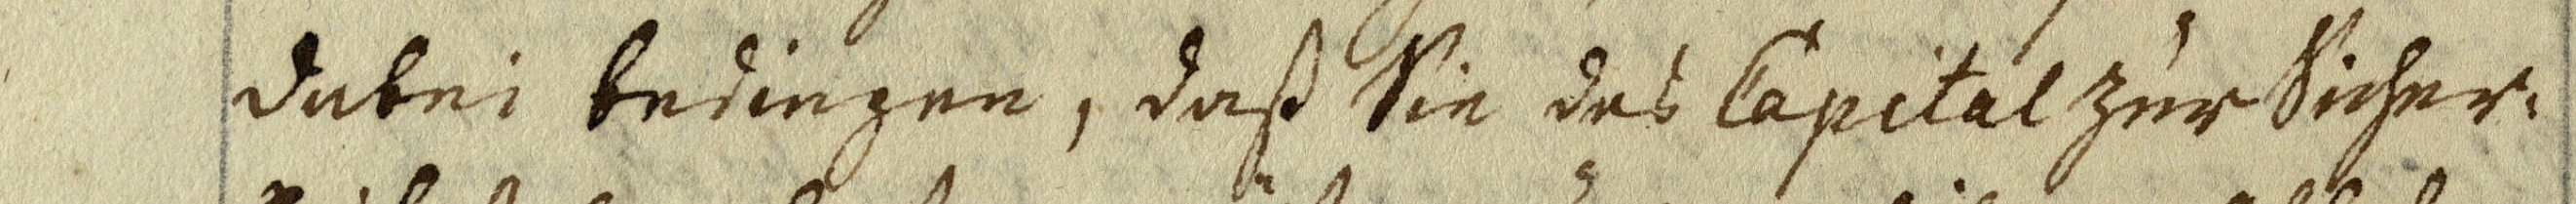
dabei bedingen, daß Sie das Capital zur Sicher¬
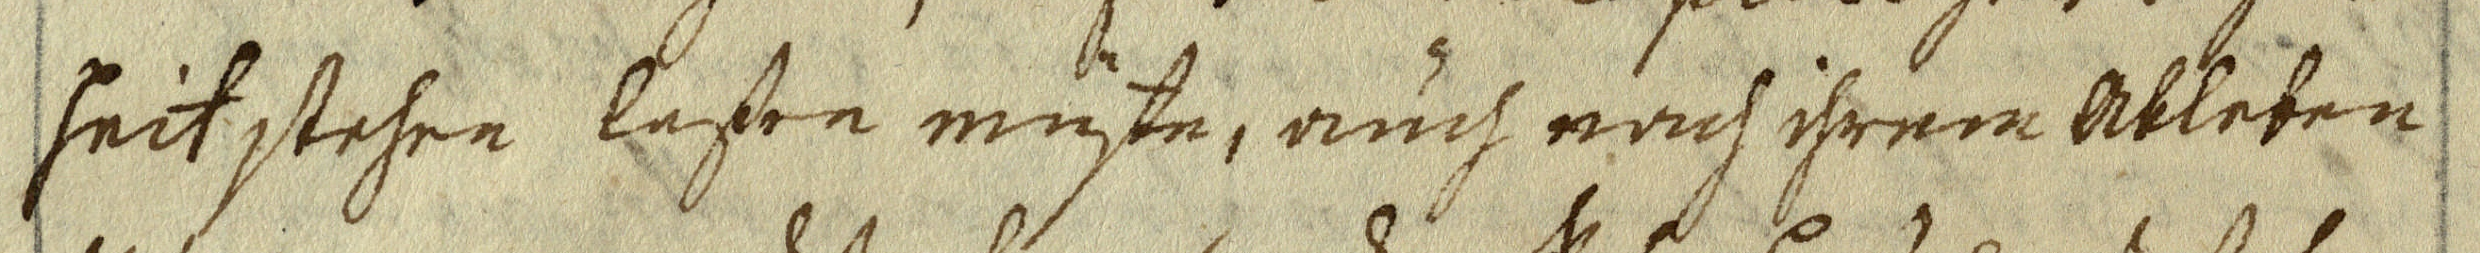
heit stehen laßen müste, auch nach ihrem Ableben
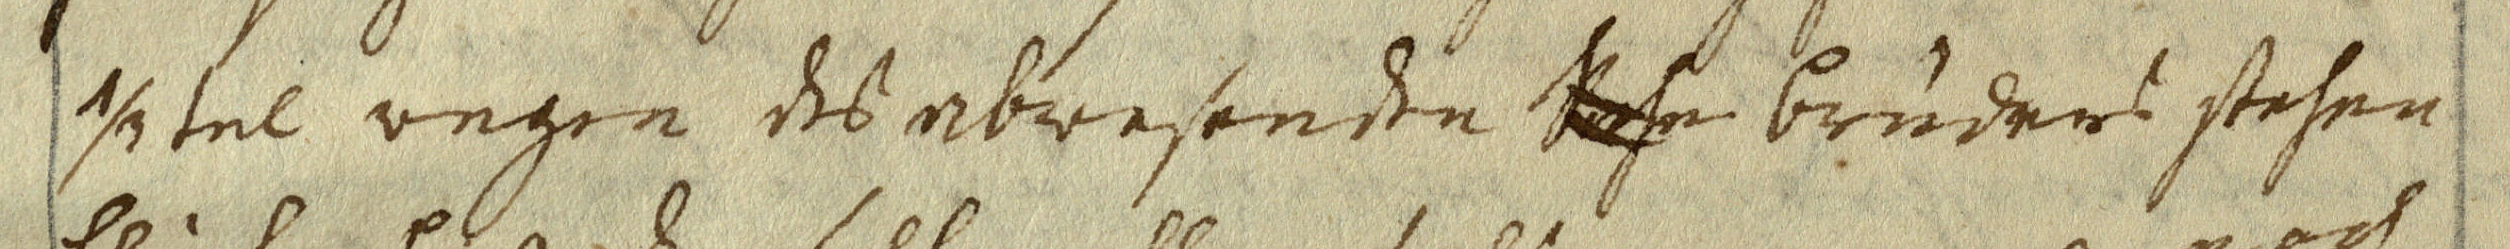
1/3 tel wegen des abwesenden Bruders stehen
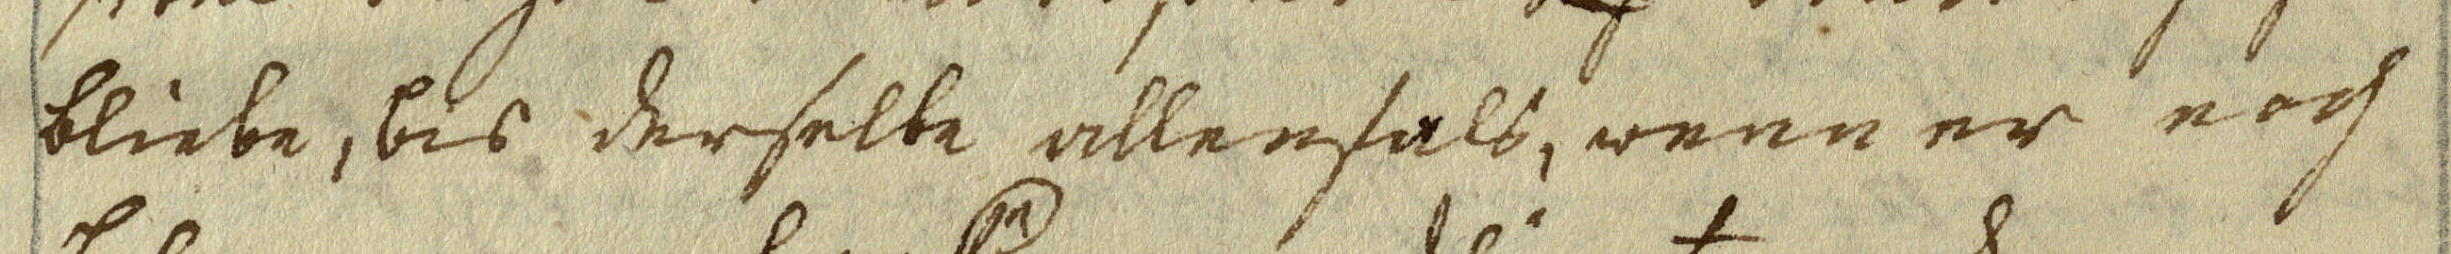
bliebe, bis derselbe allenfals, wenn er noch
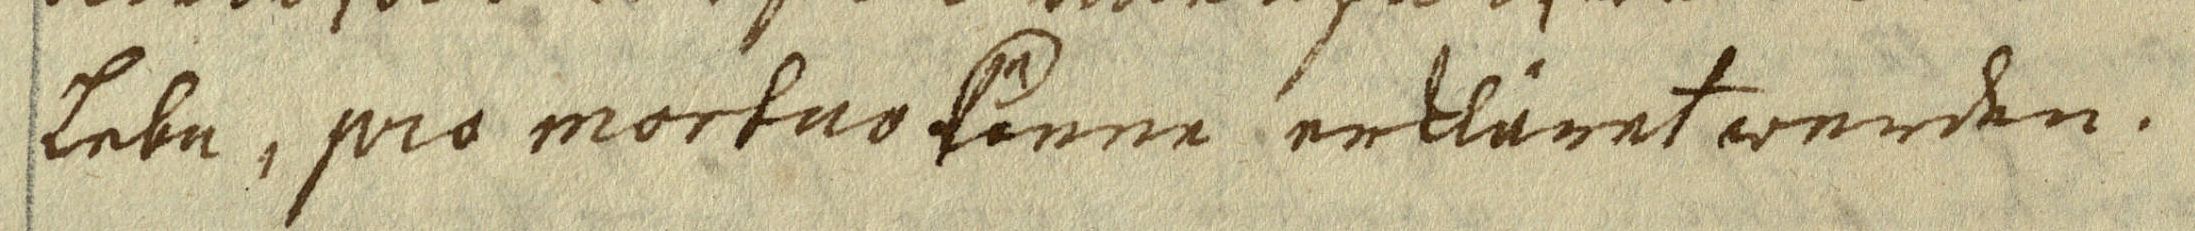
lebe, pro mortuo könne erkläret werden.
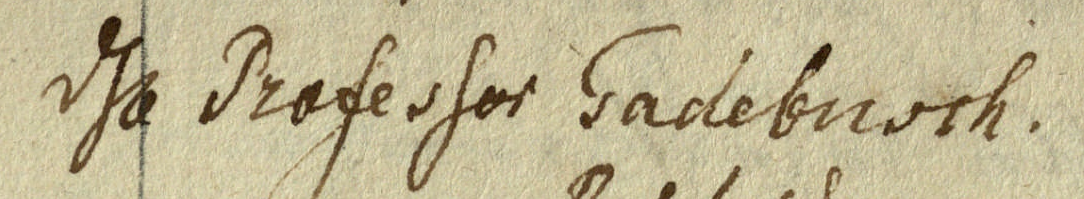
dh Professor Gadebusch
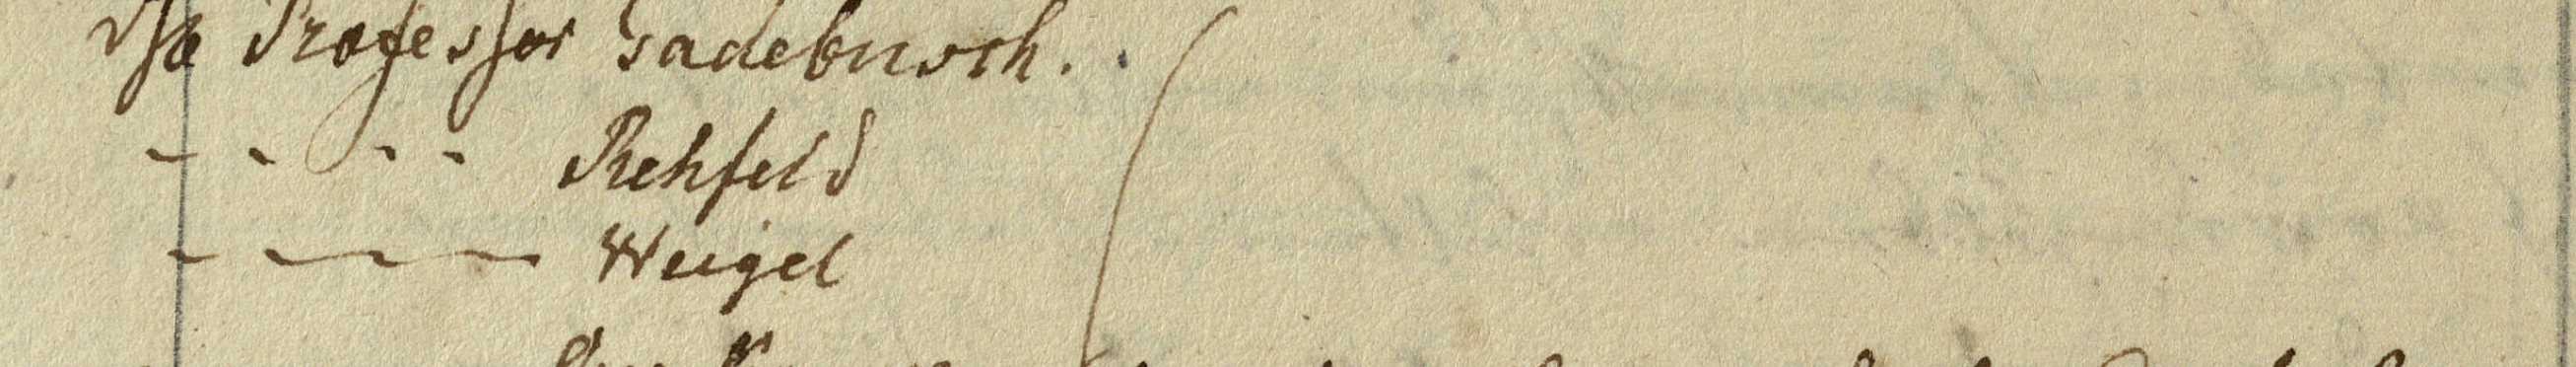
Rehfeld
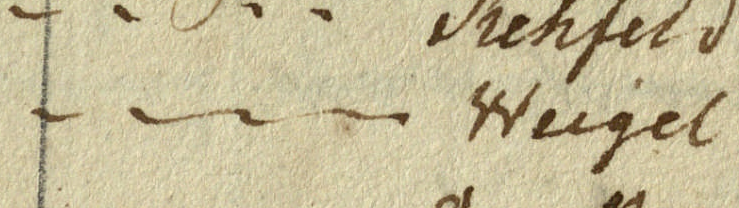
Weigel
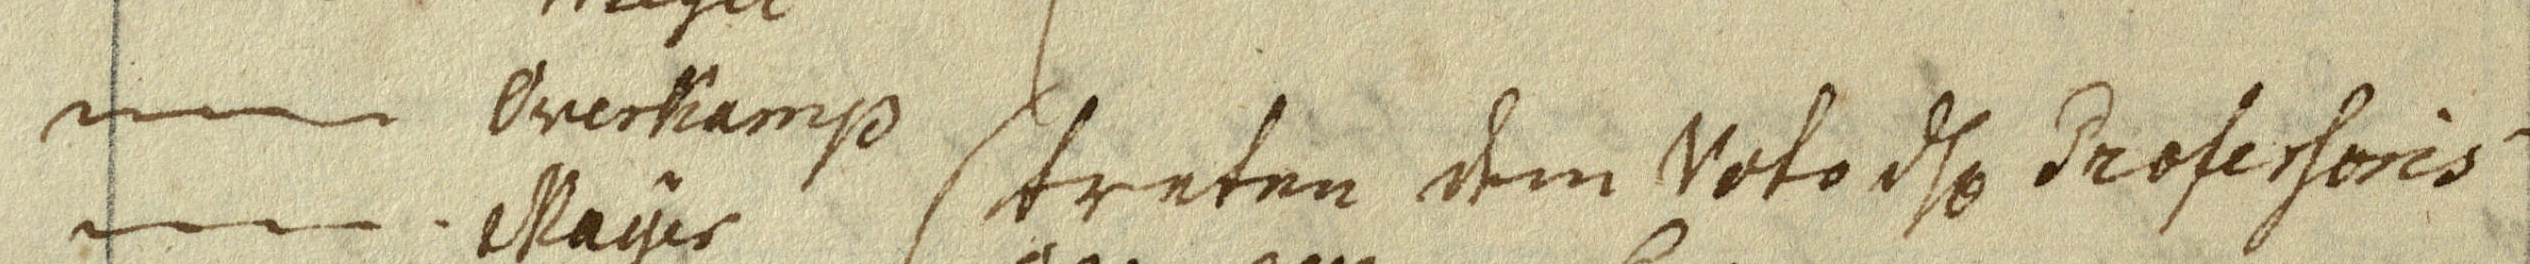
Overkamp treten dem Voto dh Professoris
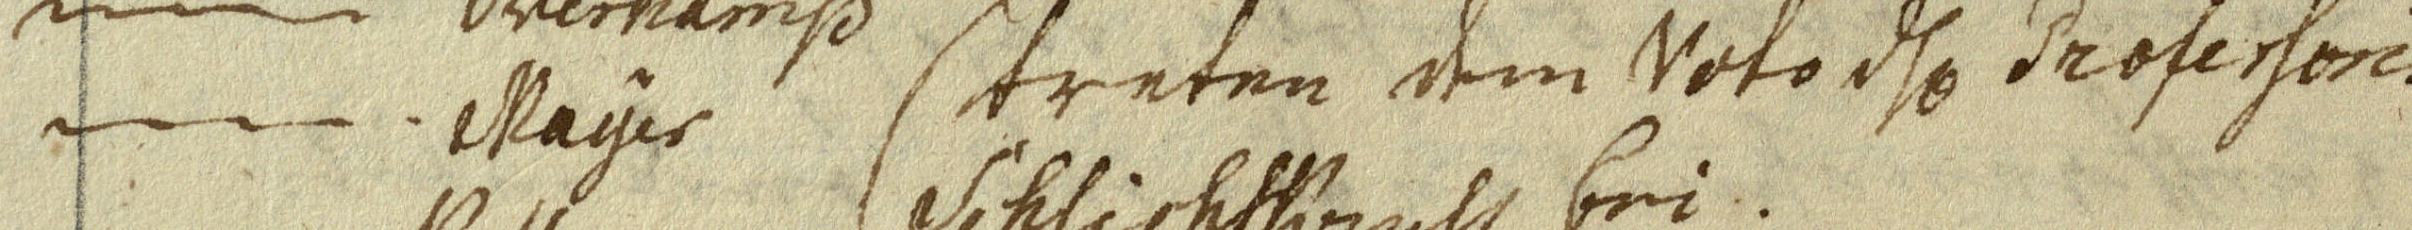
Maÿer
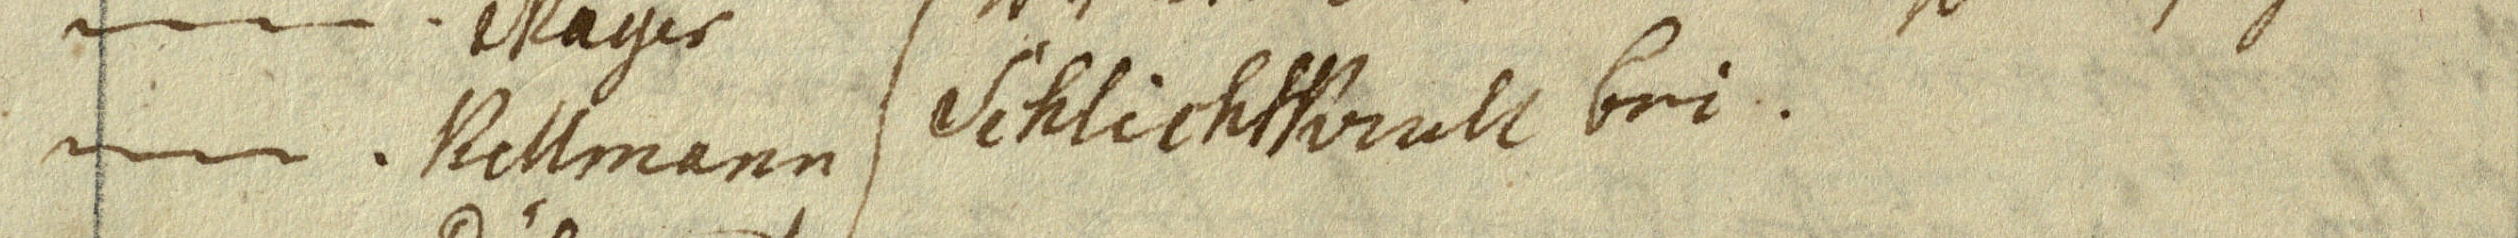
Kellmann Schlichtkrull bei.
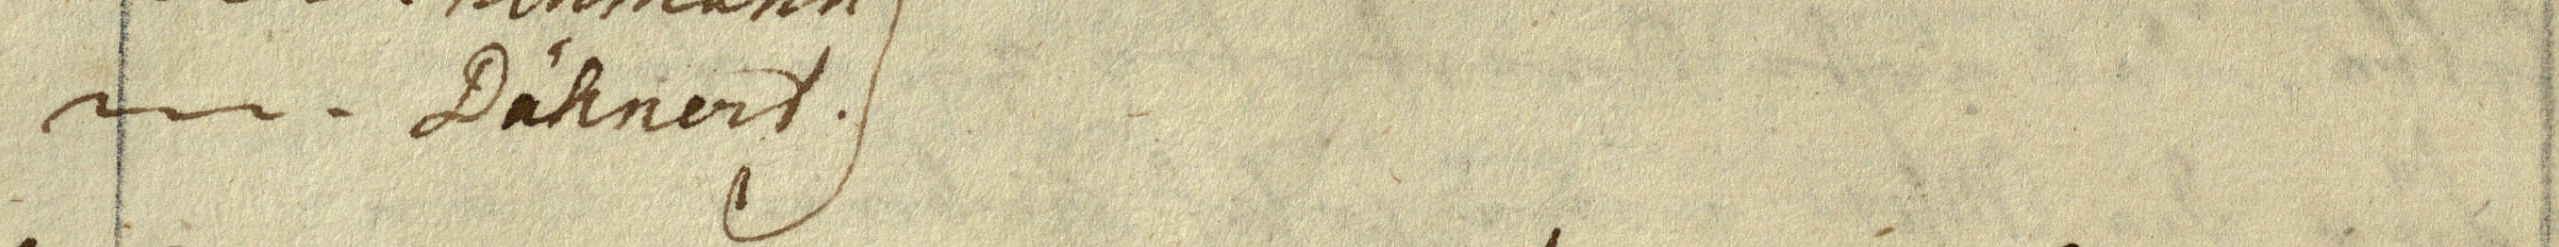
Dähnert.
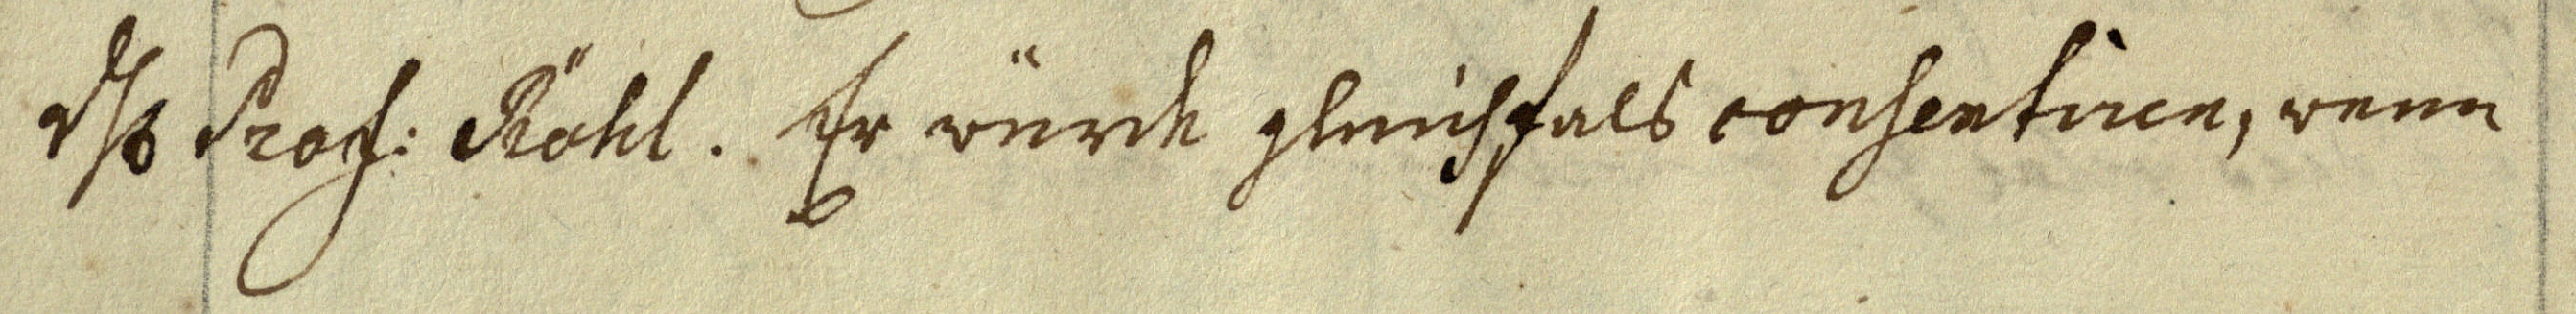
dh Prof. Röhl. Er würde gleichfals consentiren, wenn
